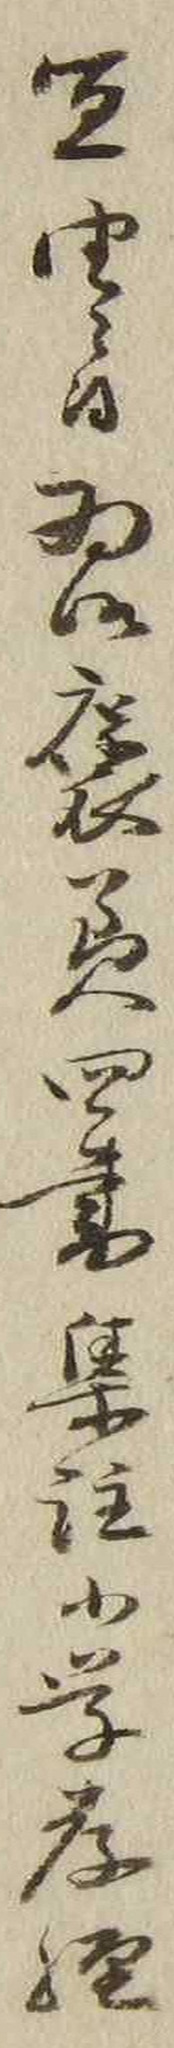宜由ニ付為御褒美四書集註小学孝経
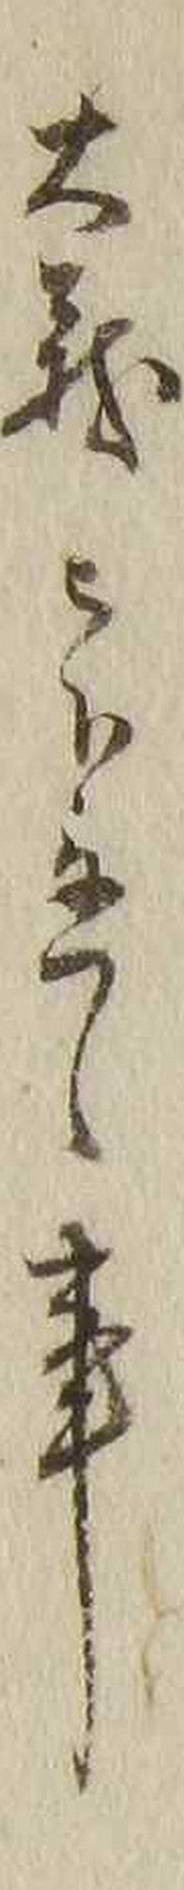大義被下置候事

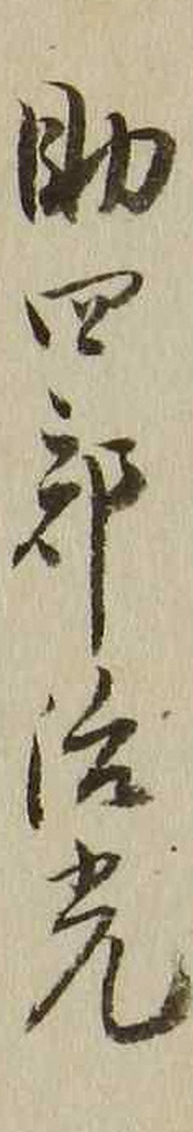助四郎治光
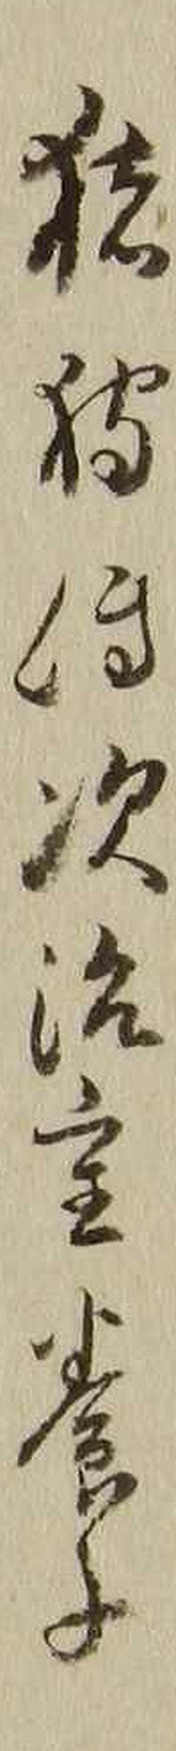猪狩伝次治重養子
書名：諸士系譜　巻之236　ふ之部4
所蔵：会津若松市立会津図書館
